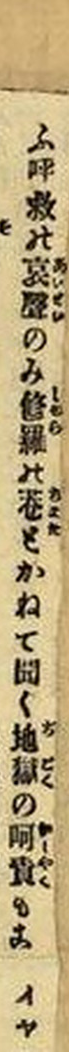ふ呼救の哀聲のみ修羅の巷とかねて聞く地獄の呵責もこ
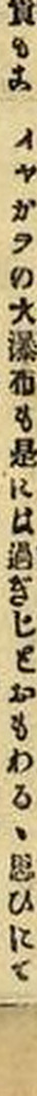イヤガラの大瀑布も是には過ぎじとおもはるゝ思ひにて
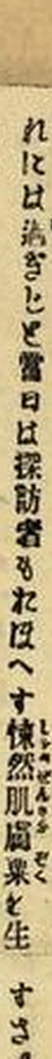れには過ぎじと當日は探訪者もおほへす悚然肌膚粟を生
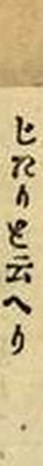じたりと云へり
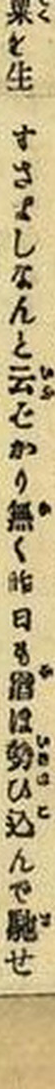すさましなんと云ばかり無く昨日も猶ほ勢ひ込んで馳せ
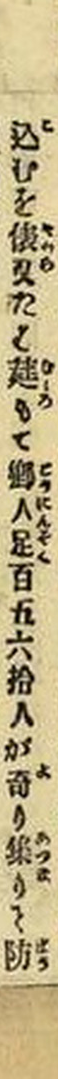込むを俵又たは莚もて郷人足百五六拾人が寄り集りて防
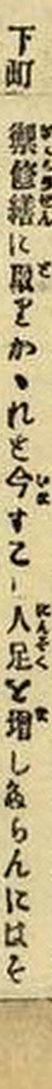禦修繕に取りかゝれと今すこし人足を増したらんにはそ
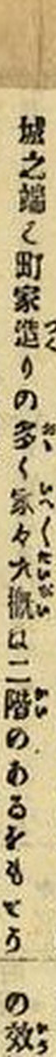城之端は町屋造りの多く家々大概は二階のあるをもてか
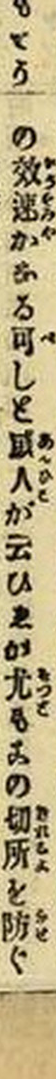の効速かなる可しと或人が云ひしが尤もこの切所を防ぐ
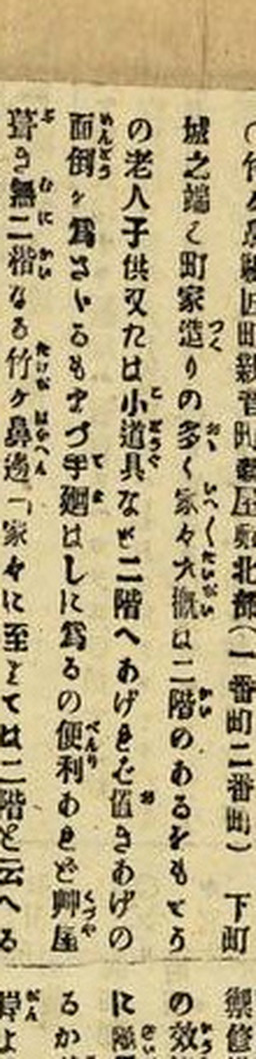の老人子供又たは小道具など二階へあげれば置きあげの
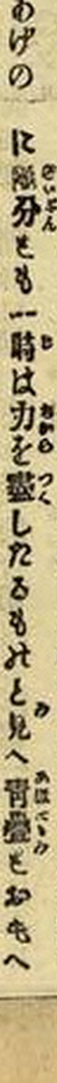に随分とも一時は力を盡したるものと見へ靑疂とおもへ
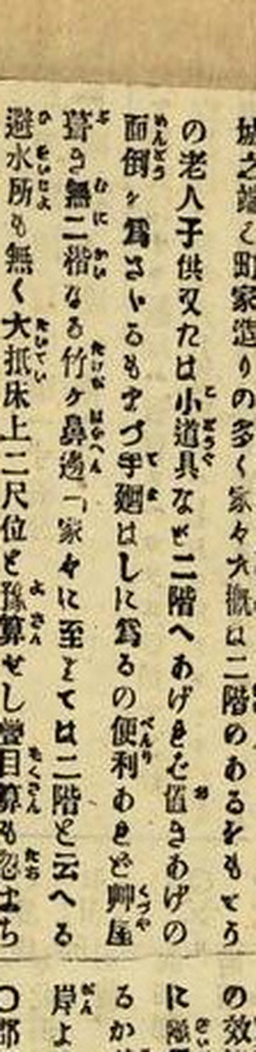面倒を爲さゞるもまづ手廻はしに爲るの便利あれど艸屋
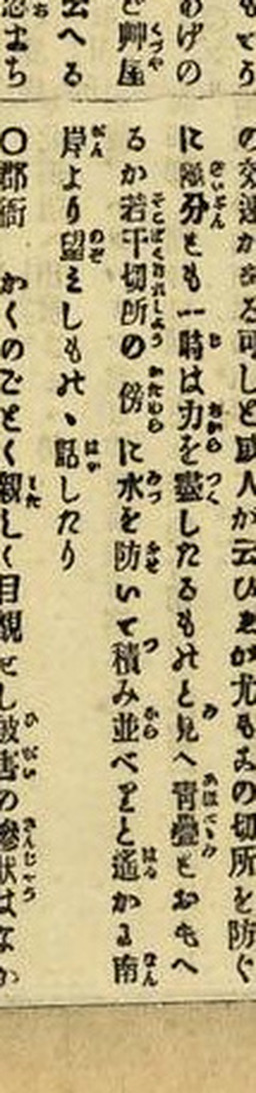るか若干切所の傍に水を防いて積み並べりと遥かに南
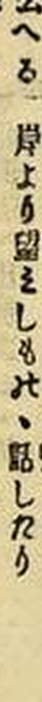岸より望みしものゝ話したり
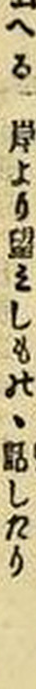岸より望みしものゝ話したり
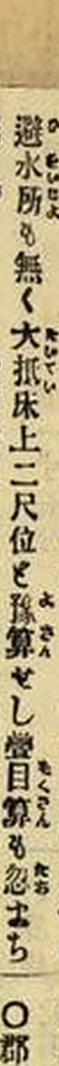避水所も無く大抵床上二尺位と豫算せし畳目算も忽まち
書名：温古集 五巻
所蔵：福井県文書館 Fukui Prefectural Archives
